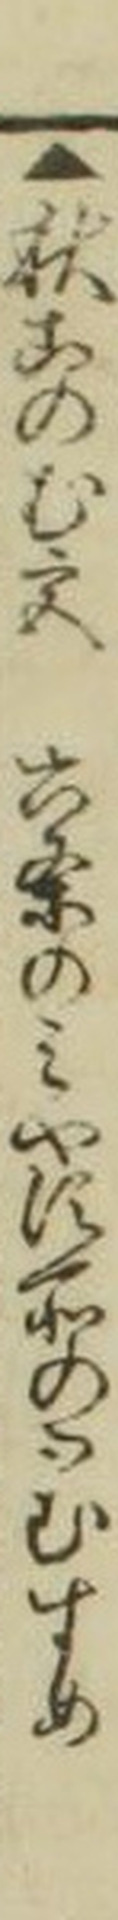▲秋このむ宮六条のみやす所の御むすめ
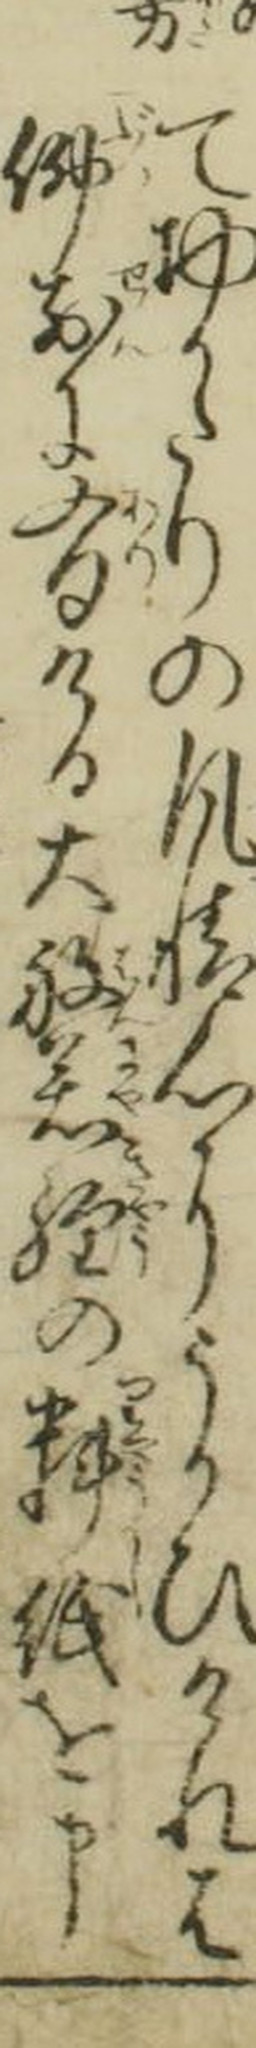仏前に有ける大般若経の料紙を申
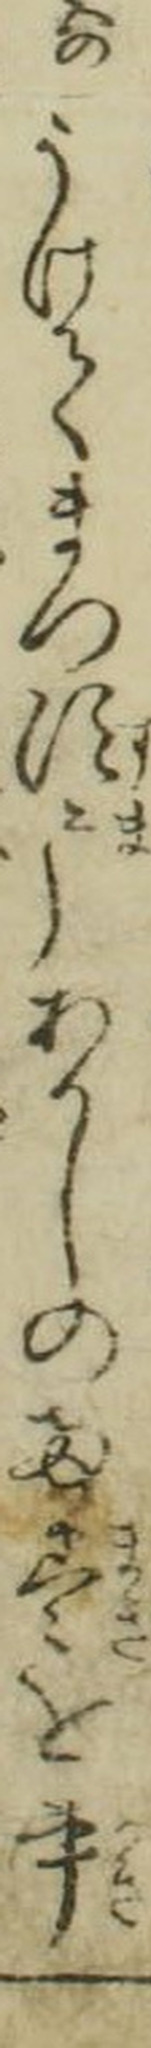うけてまつ須磨あかしの両巻を書
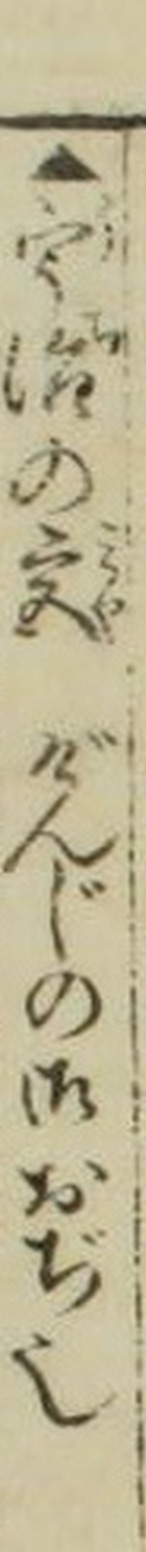▲宇治の宮げんじの御おぢ也
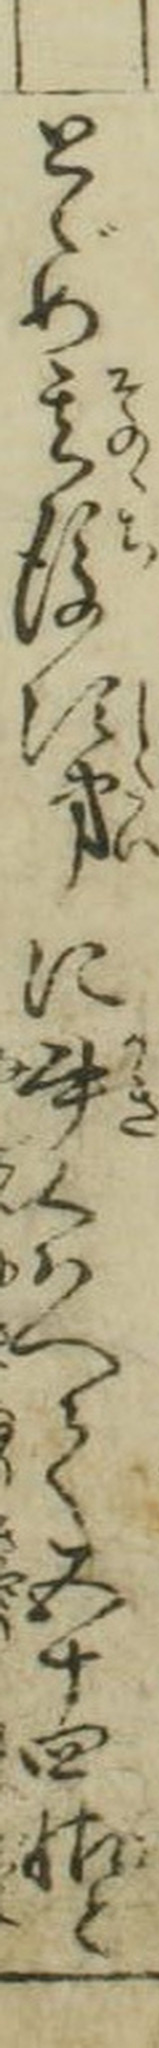とゞめ其後次第に書くはへて五十四帖と
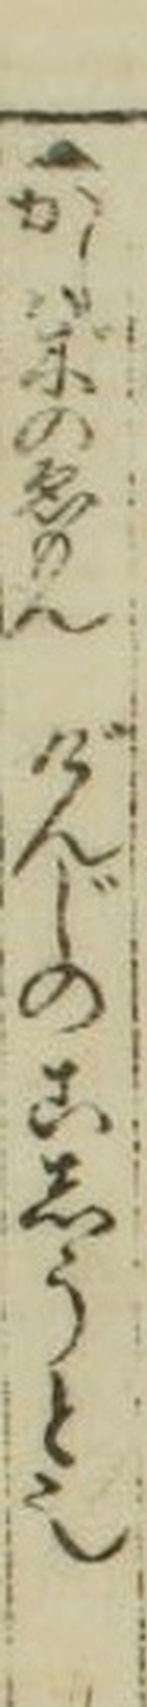▲かしはぎのゑもんげんじのこしうと也
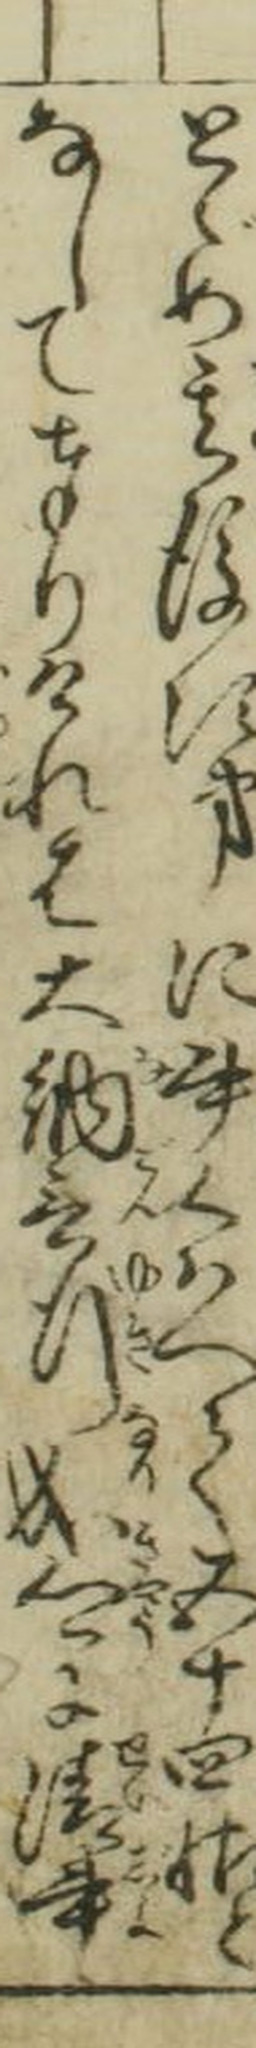なして奉りけれは大納言行成卿に清書
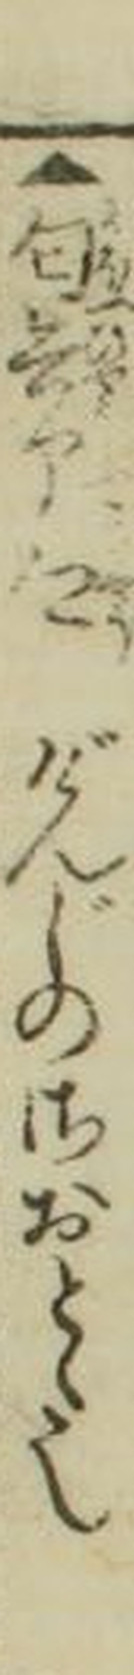▲匂兵部卿げんじの御おとゝ也
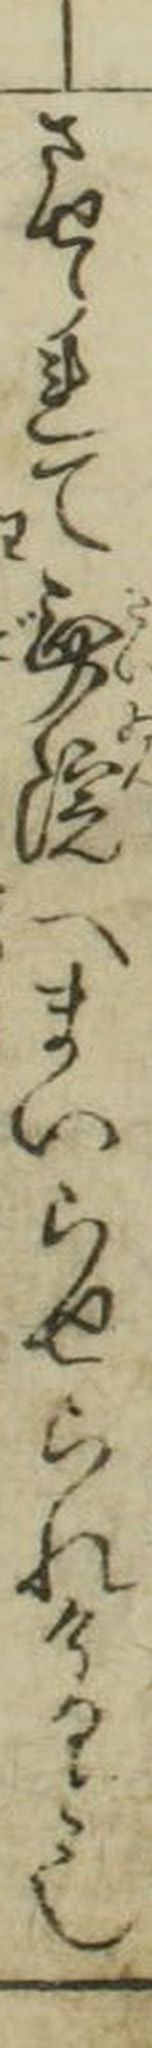させられて斎院へまいらせられけると也
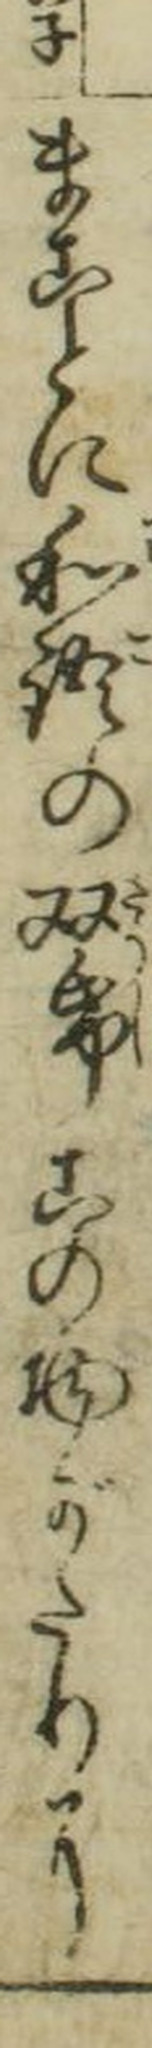まことに和語の双紙この物がたりに
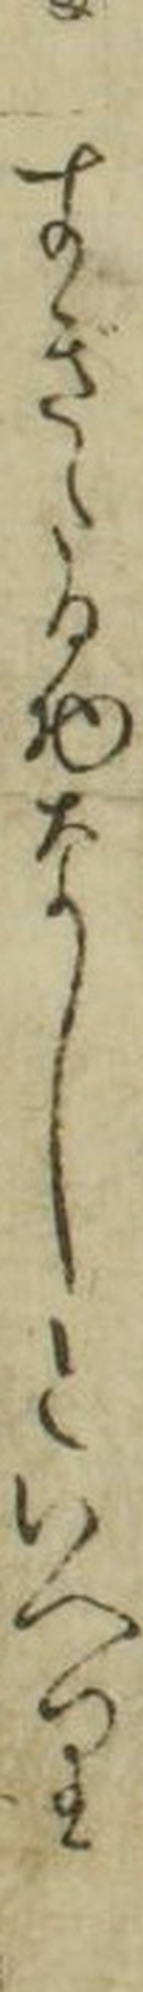すぎたる物なしといへり

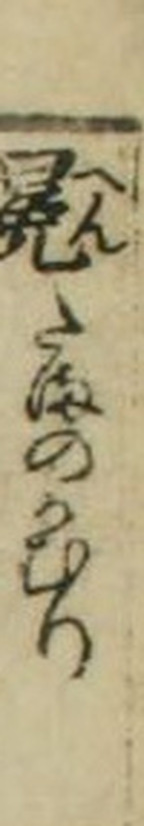冕たまのかむり
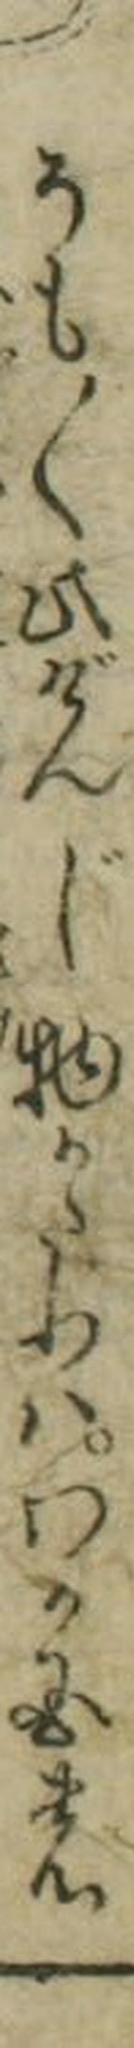そも〳〵此げんじ物かたりは。わか国の
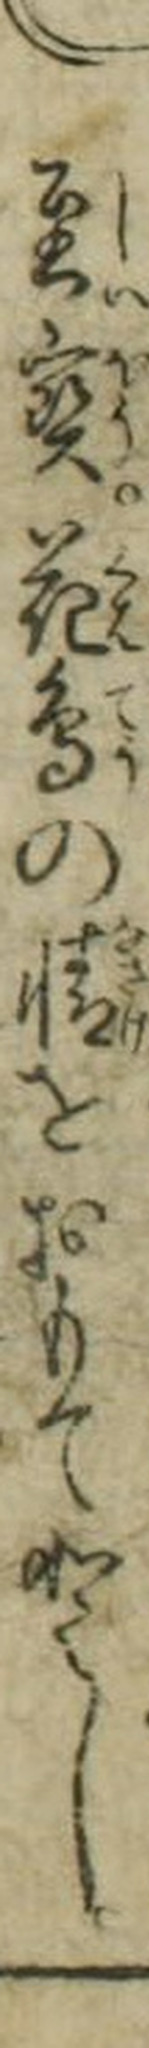至宝。花鳥の情をおもてとし
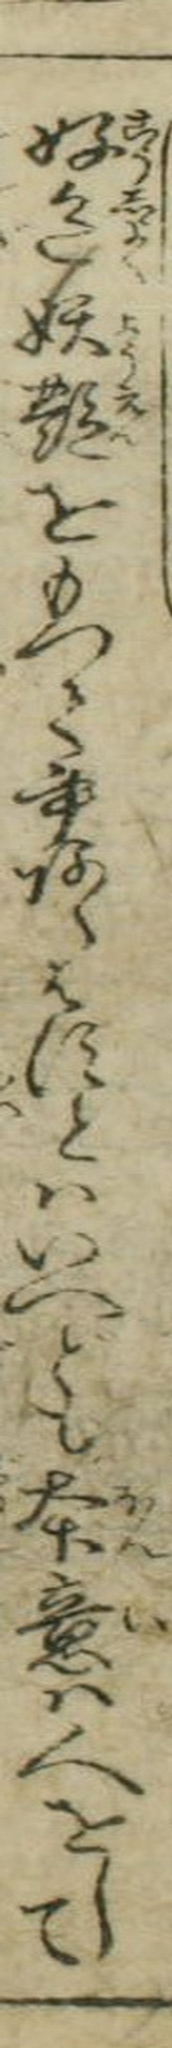好色妖艶をもつて書あらはすとはいへども本意は人をして
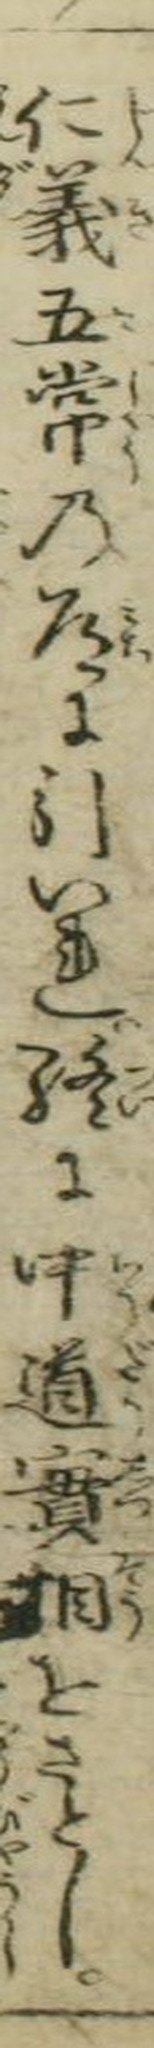仁義五常の道に引いれ。終に中道実相をさとし。
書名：女源氏教訓鑑
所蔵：東京学芸大学附属図書館
